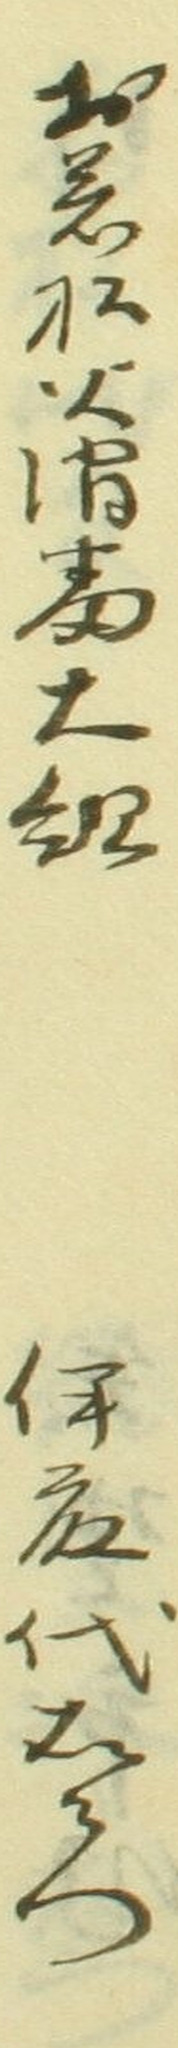於若松火消番大組伊藤代右衛門
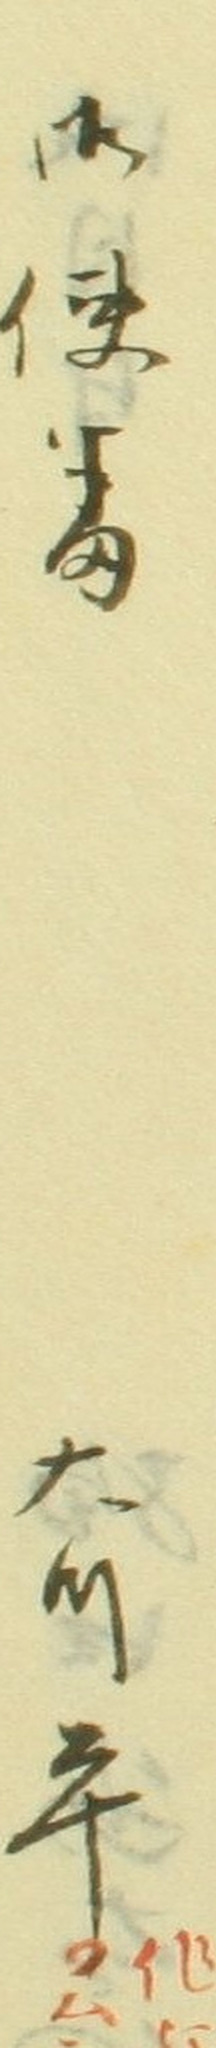御使番大川平
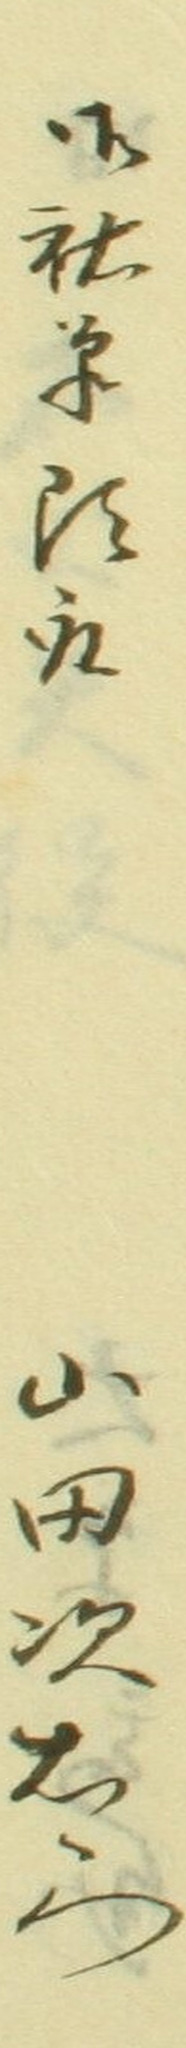御祐筆頭取山田次右衛門
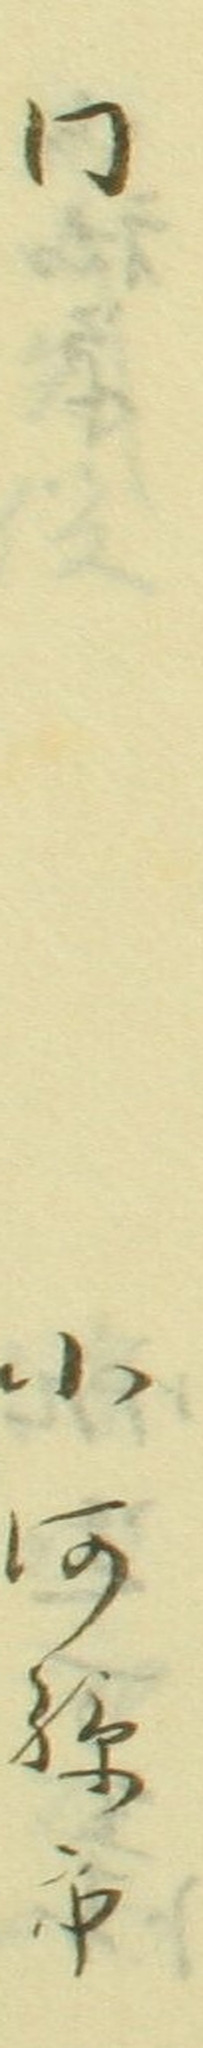同小河孫市
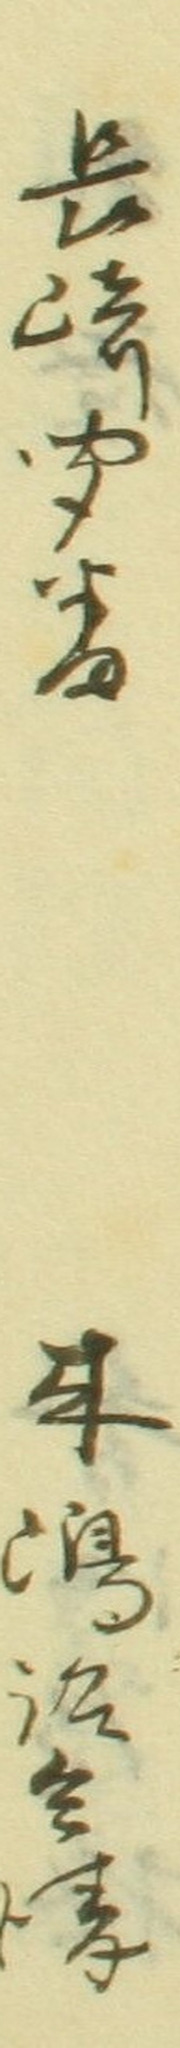長崎聞番来嶋治兵衛
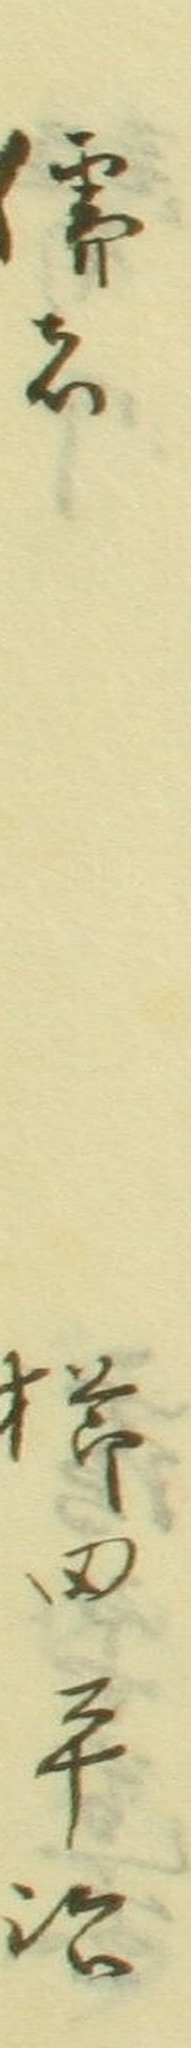儒者櫛田平治

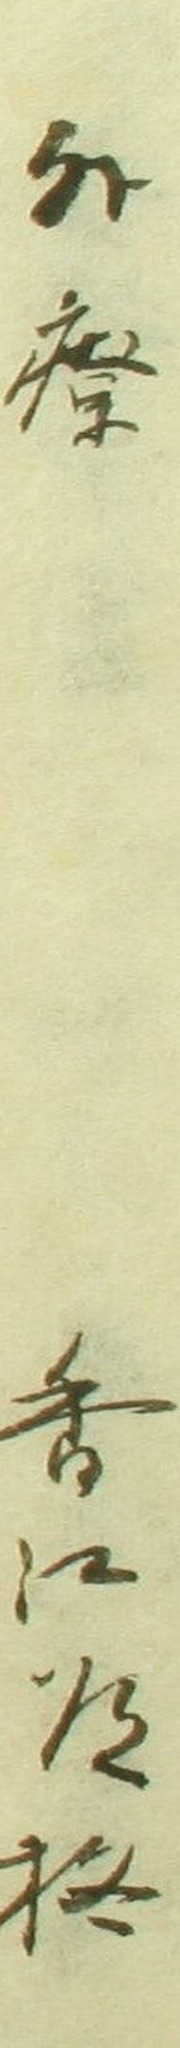外療香江道柊
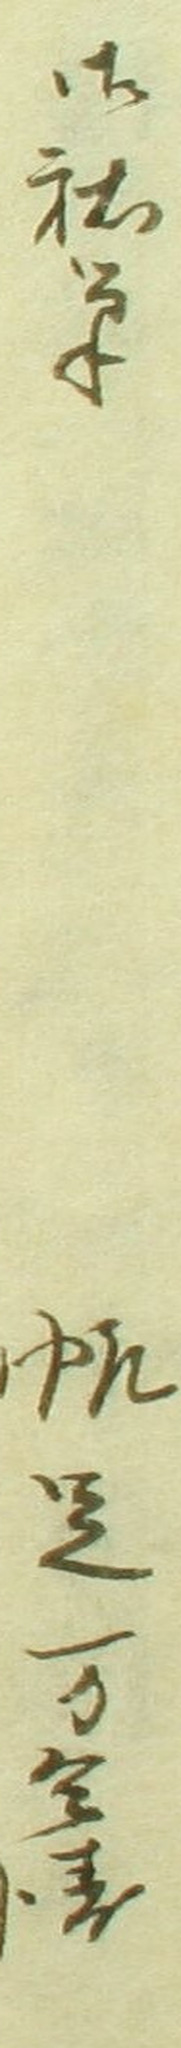御祐筆帆足万兵衛
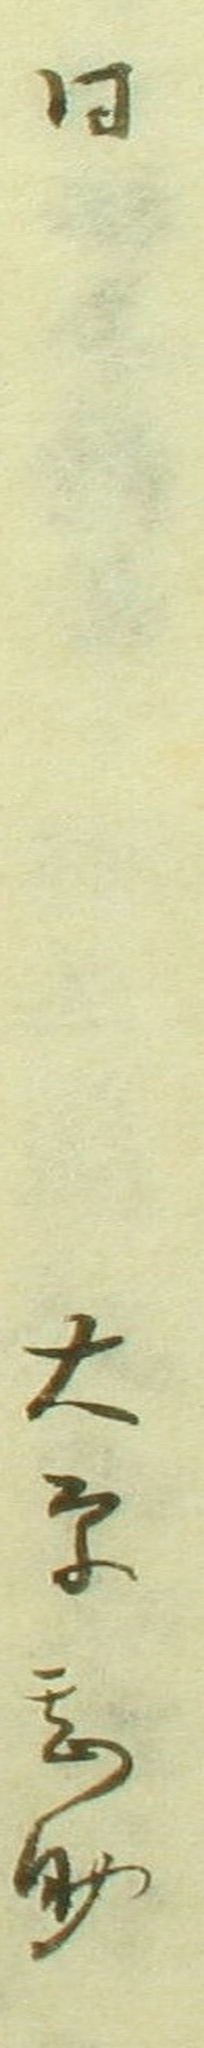同大原甚助
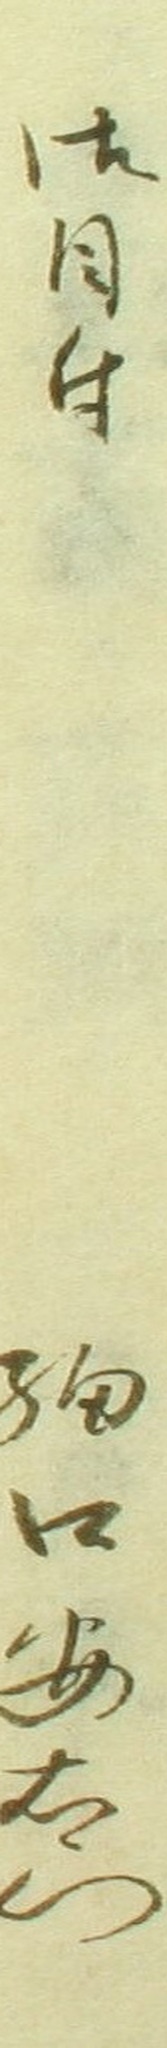御目付細口安右衛門
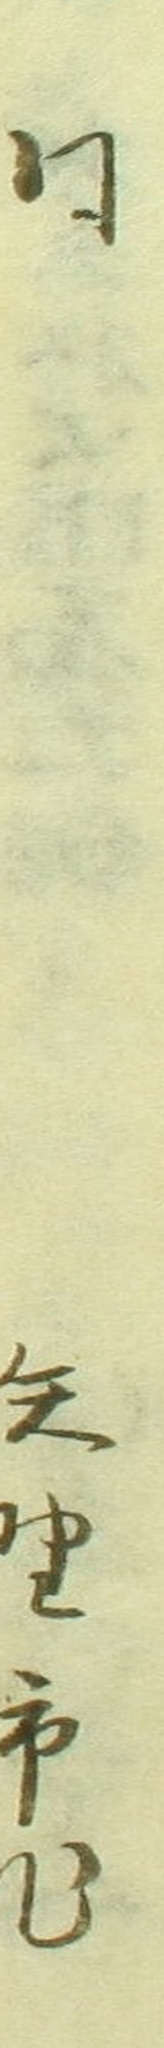同矢野市作
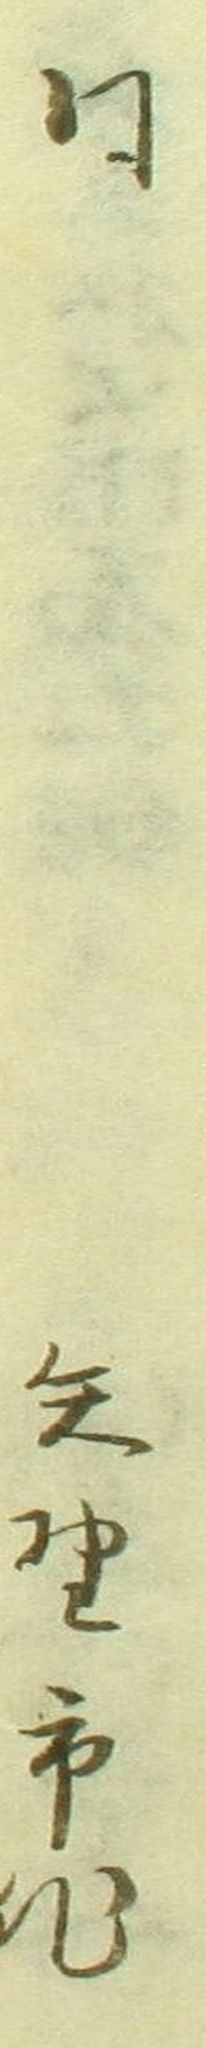同矢野市作
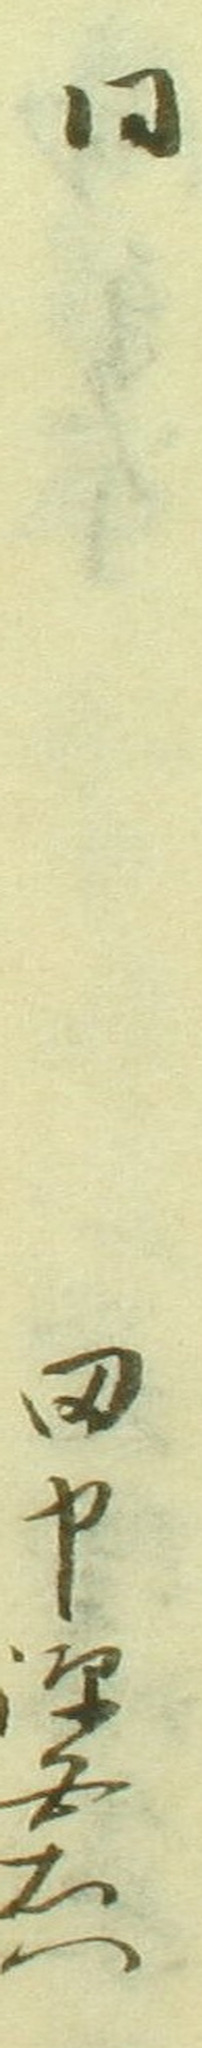同田中源五右衛門
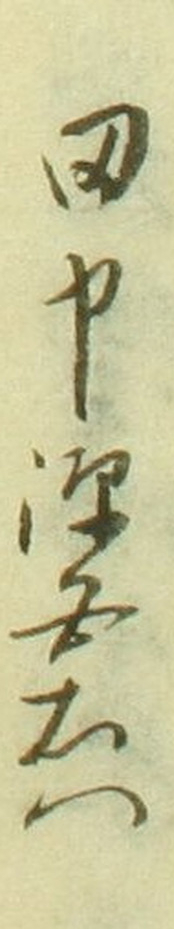同田中源五右衛門
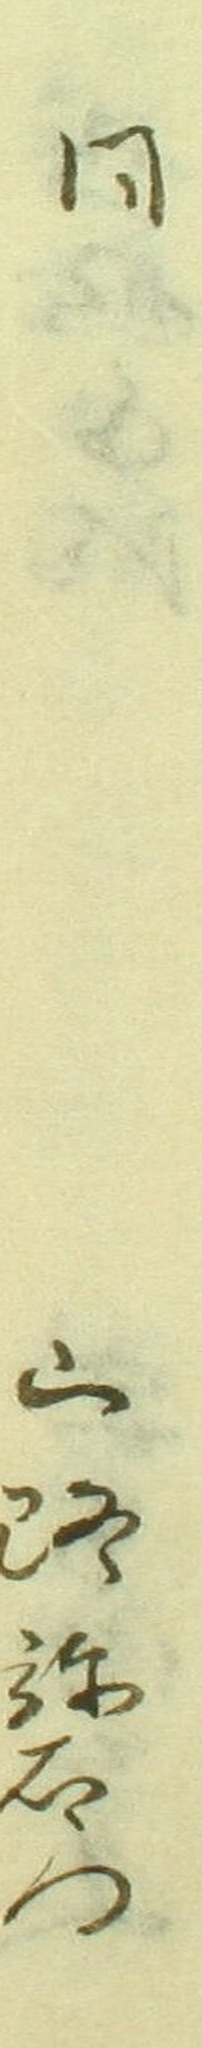同山路弥右衛門
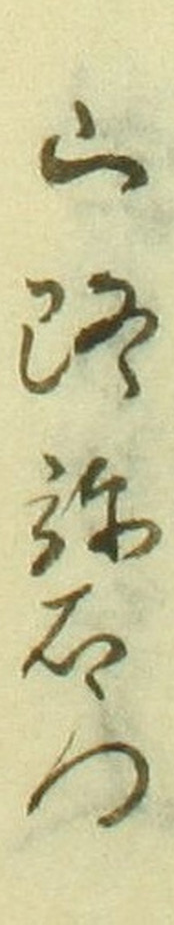同山路弥右衛門
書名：唐船漂流記 二
